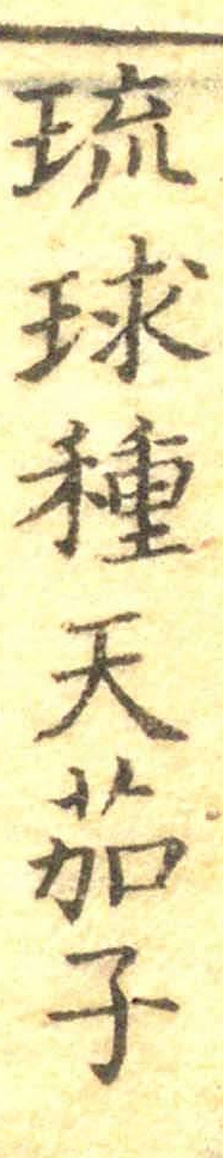琉球天茄子

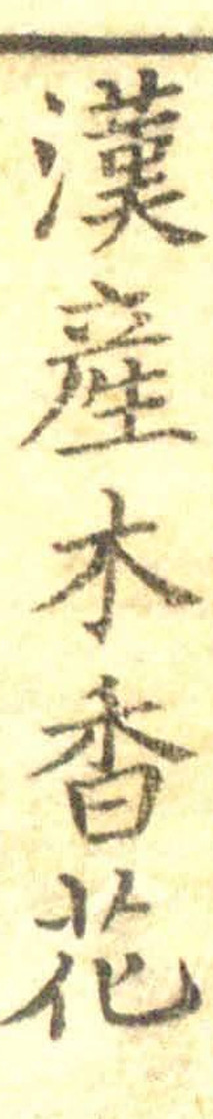漢産木香花

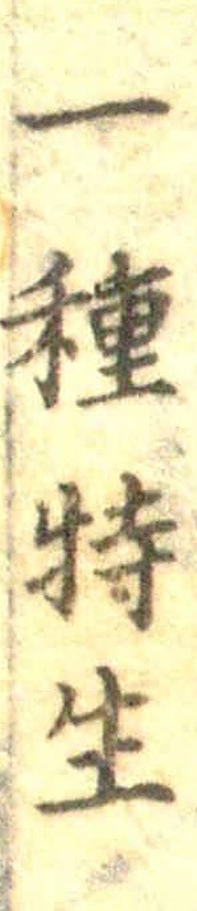一種特生

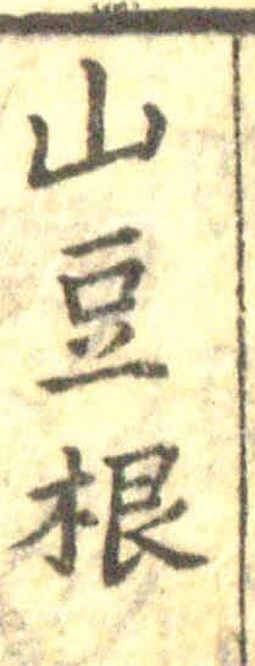山豆根

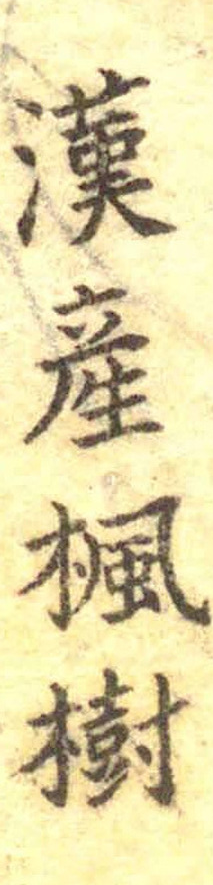漢産楓樹
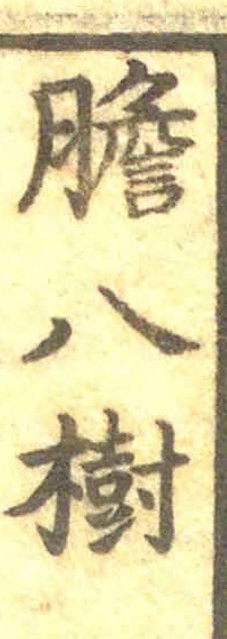胆八樹

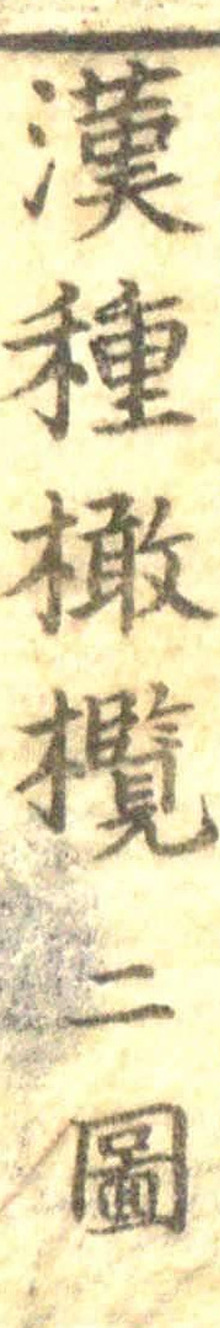漢種橄欖二図
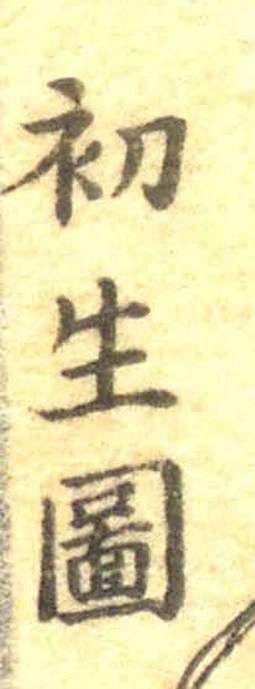初生図

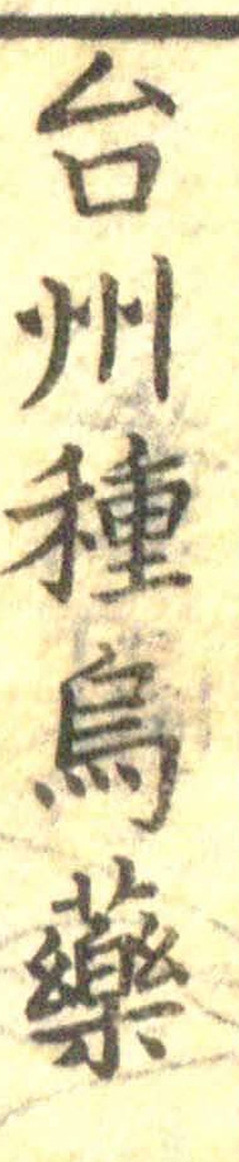台州種烏薬
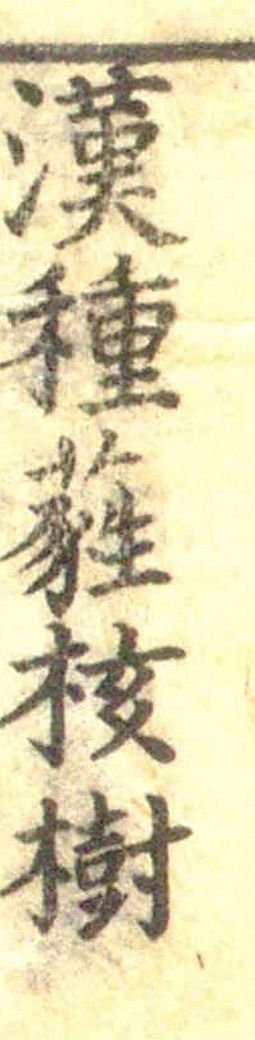漢種蕤核樹

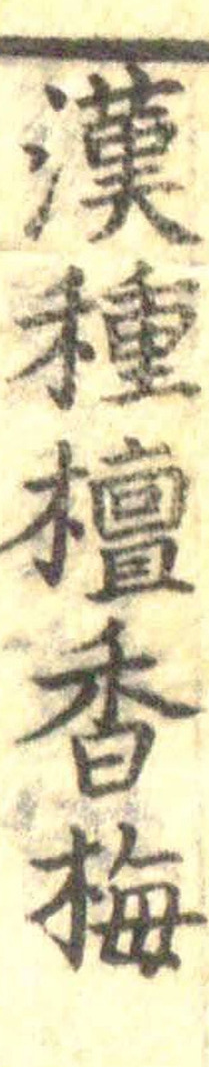漢種檀香梅

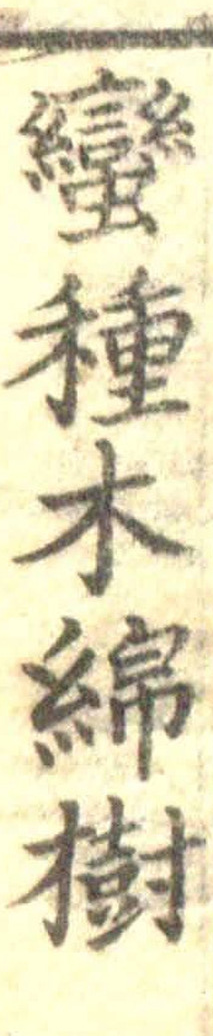蛮産木綿樹
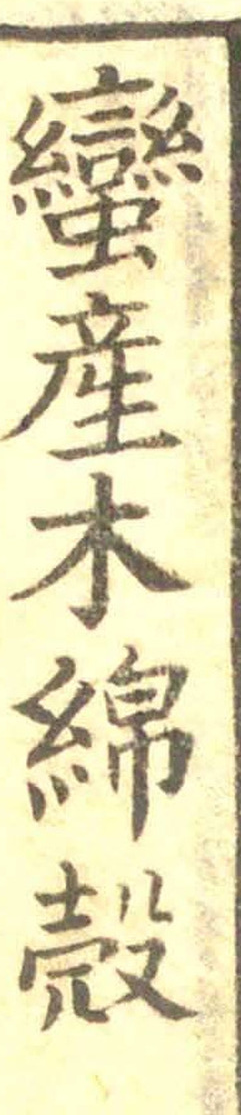蛮産木綿殻

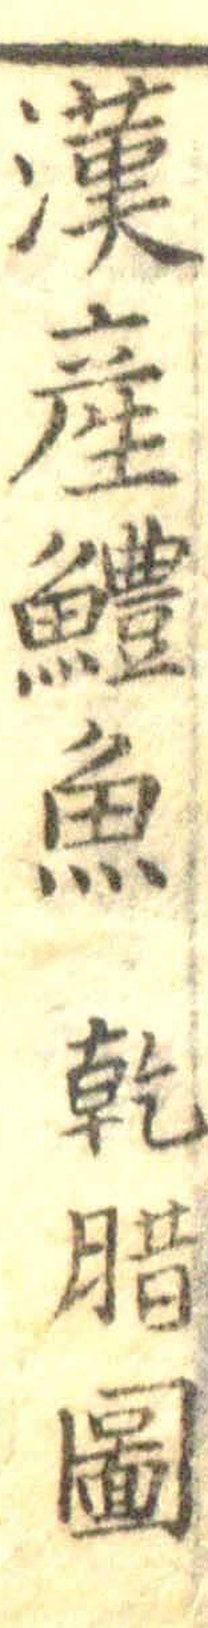漢産鱧魚乾腊図

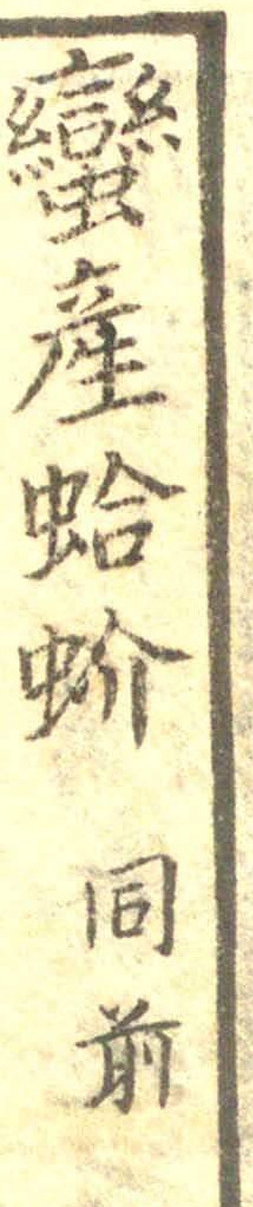蛮産蛤蚧同前
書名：物類品隲
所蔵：国文学研究資料館
